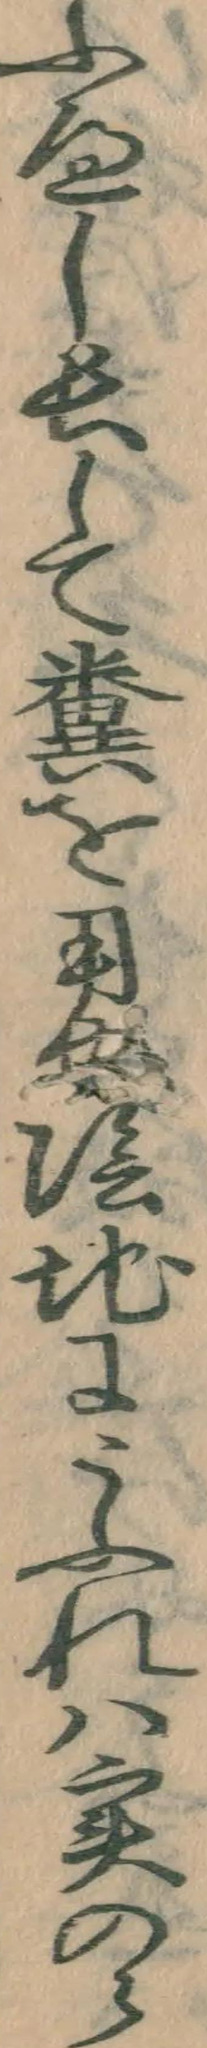ふへし長して糞を用ゆ陰地にうふれは実のら

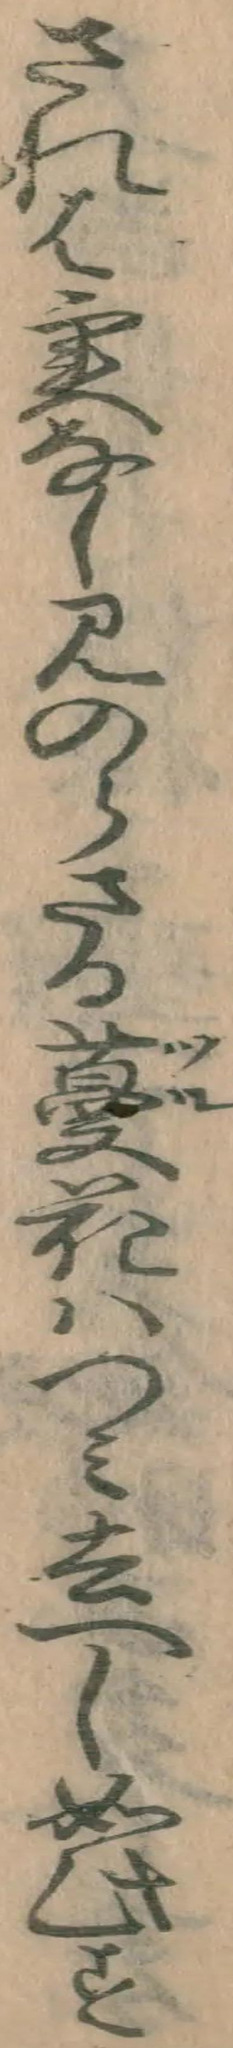されは実なしみのらさる蔓花はつみ去へし如此す
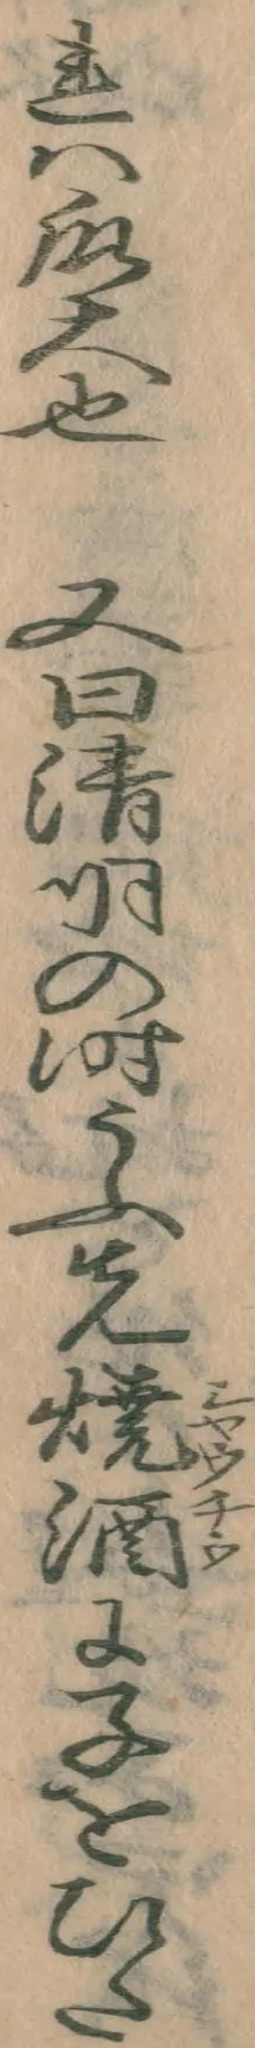れは瓜大也又曰清明の時うふ先焼酎に子をひた
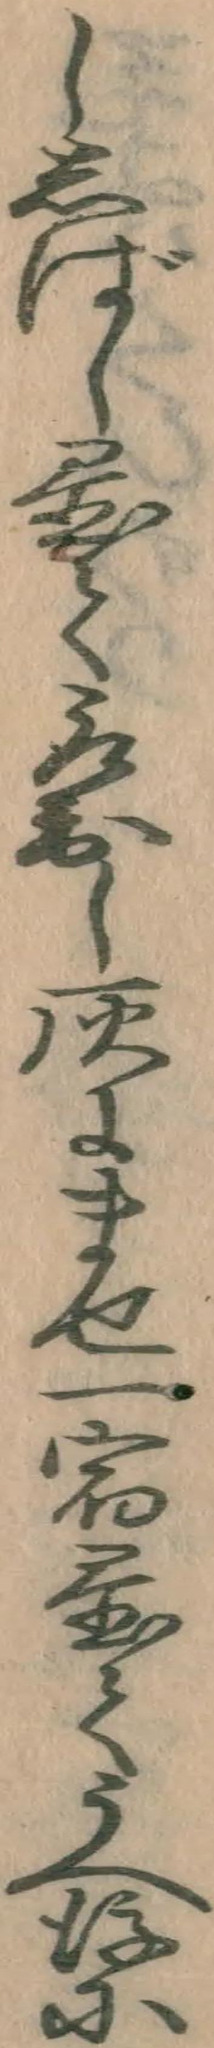ししばし置て取出し灰にませ一宿置てうへ後に
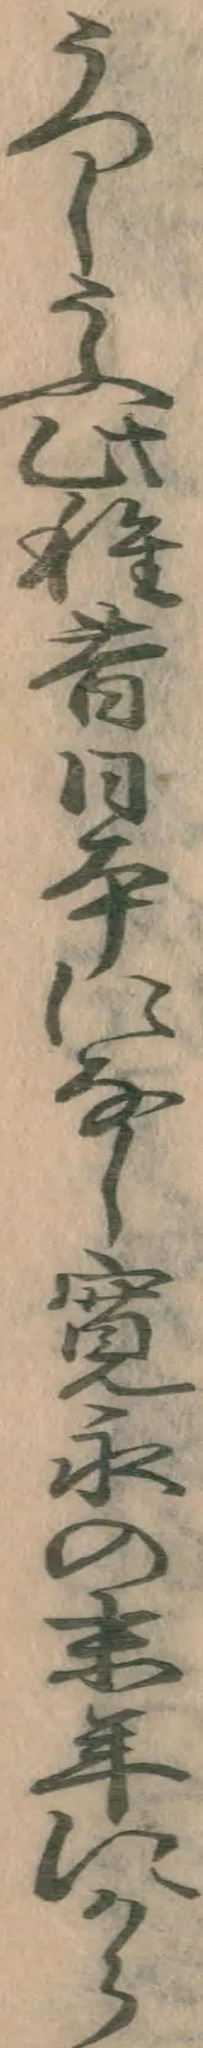うつしうふ此種昔日本になし寛永の末年にから
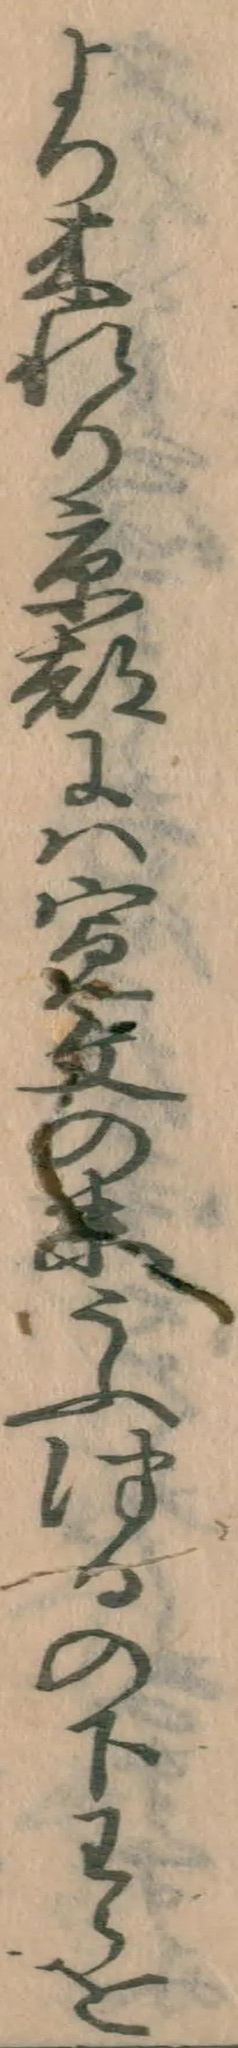より来れり京都には寛文の末うふつるの下わらを
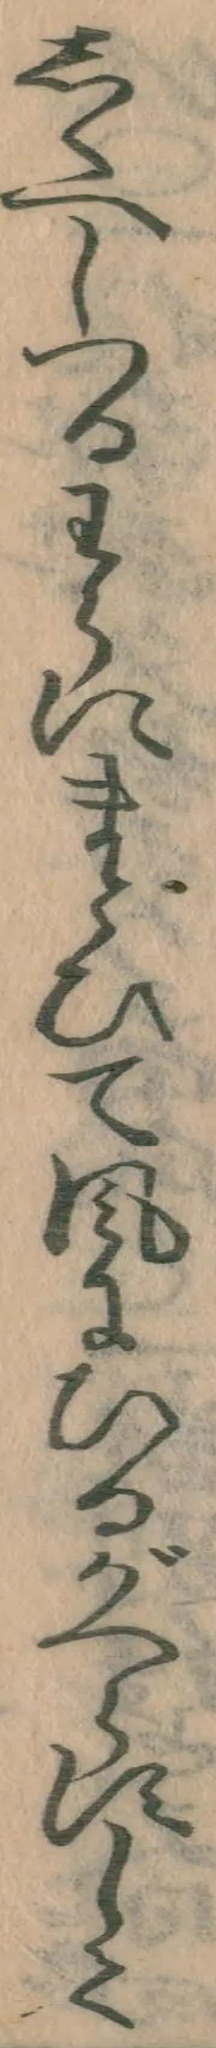しくへしつるわらにまとひて風にひるがへらすして
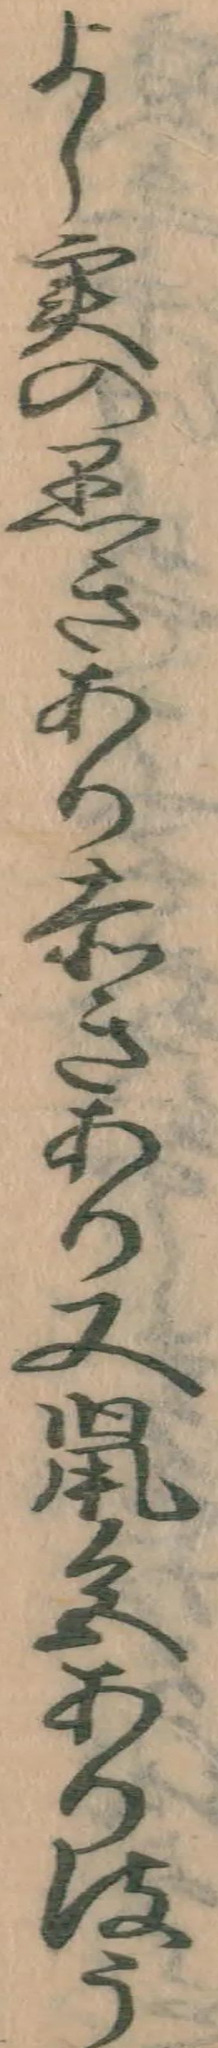よし実の黒きあり赤きあり又鼠色ありはう
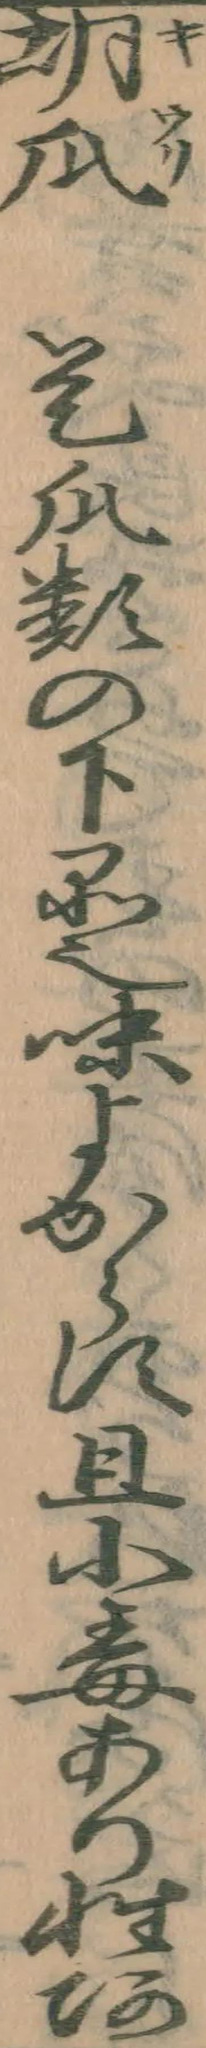胡瓜是瓜類の下品也味よからす且小毒あり性あ
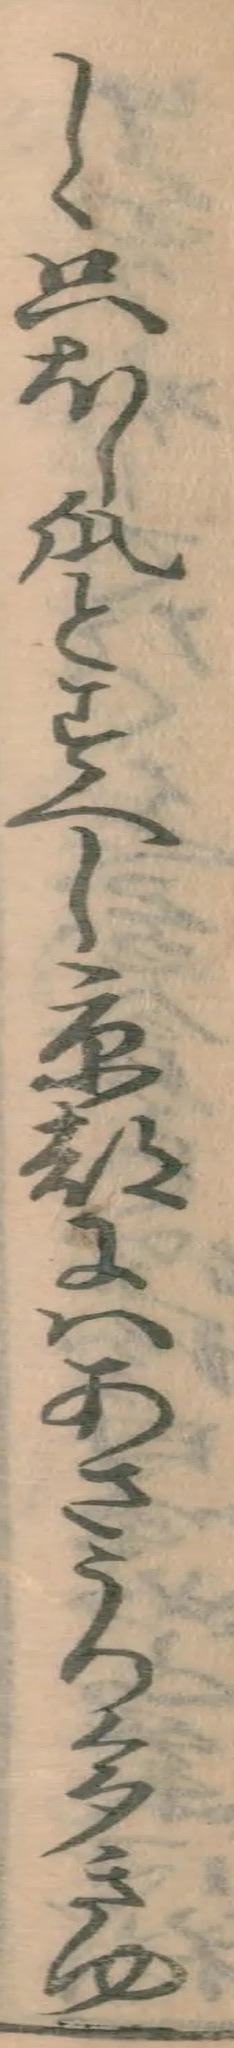しく只ほし瓜とすへし京都にはあさうり多きゆ
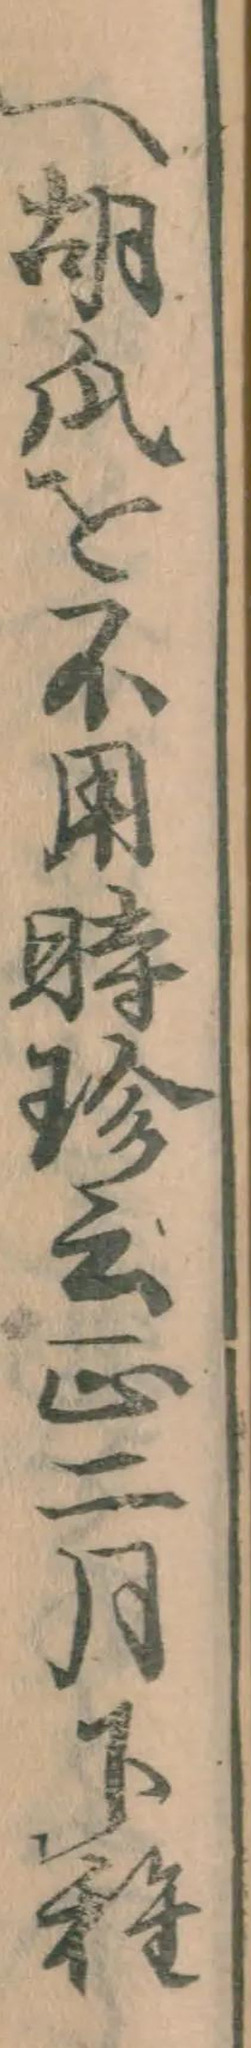へ胡瓜を不用時珍云正二月下種
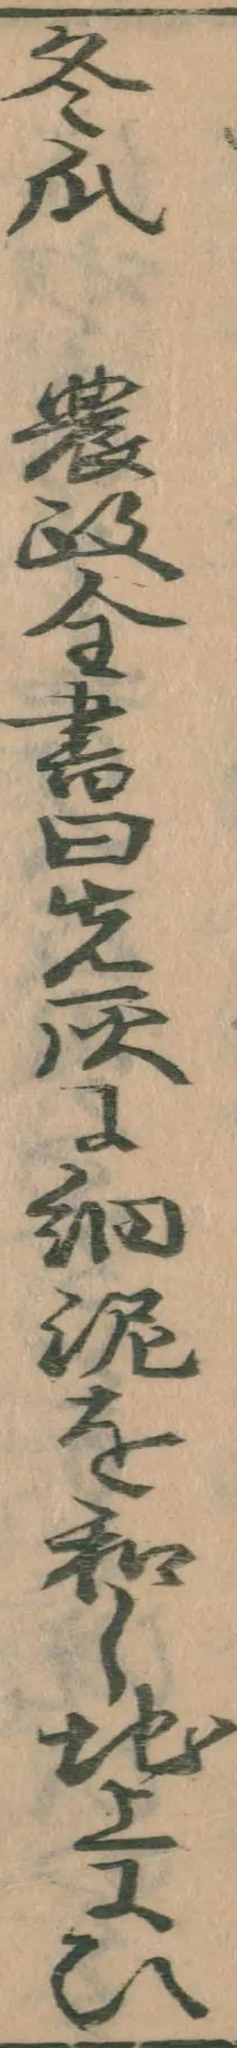冬瓜農政全書曰先灰に細泥を和し地上にひ
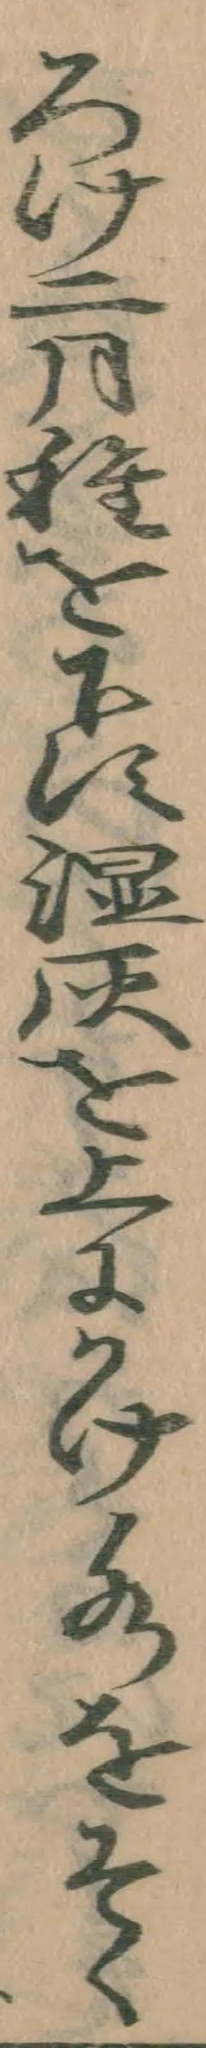ろけ二月種を下す湿灰を上にかけ水をそゝ
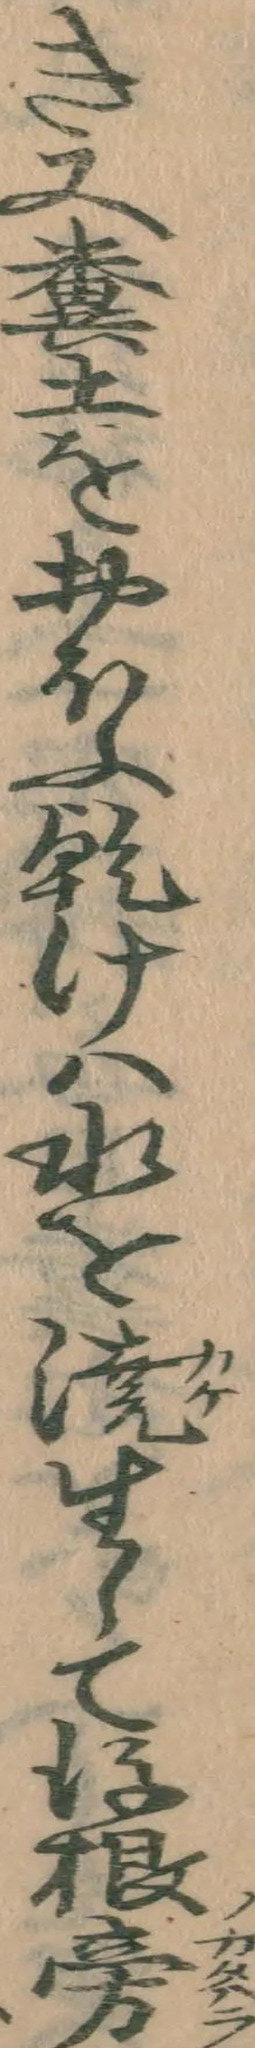き又糞をおほふ乾けは水を澆生して後根旁
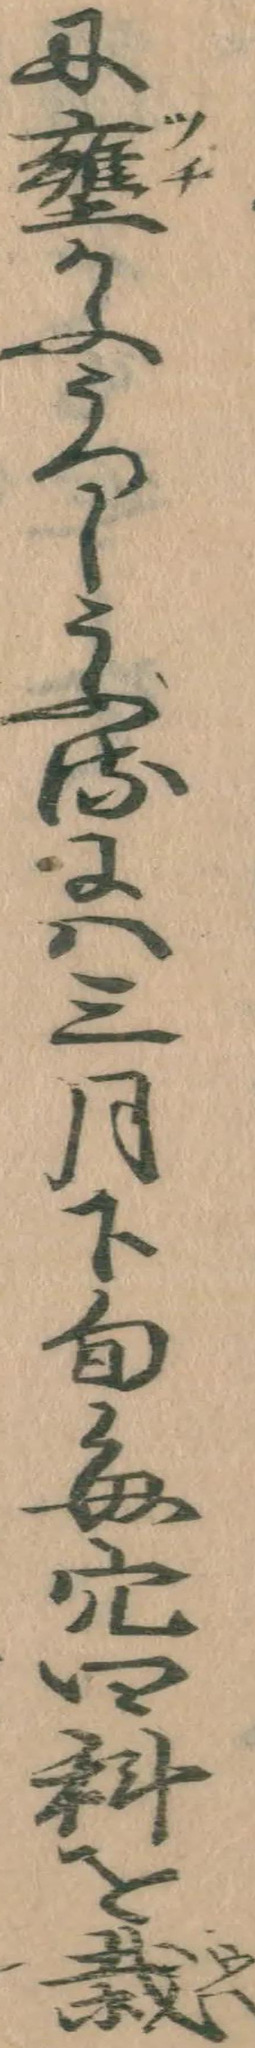に壅うふうつしうふるには三月下旬毎穴四科を栽
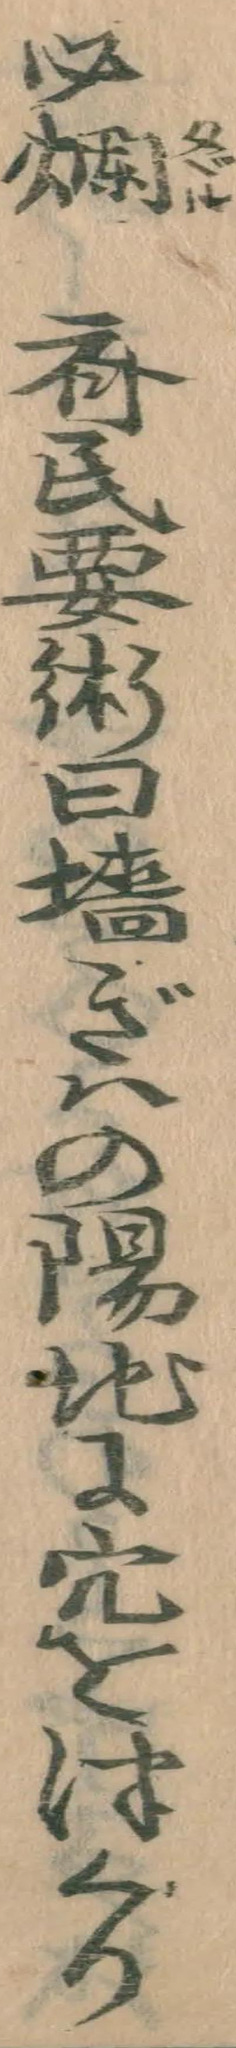必爛斉民要術曰墻ぎはの陽地に穴をつくり
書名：菜譜 3巻
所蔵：国立国会図書館 National Diet Library, JAPAN
